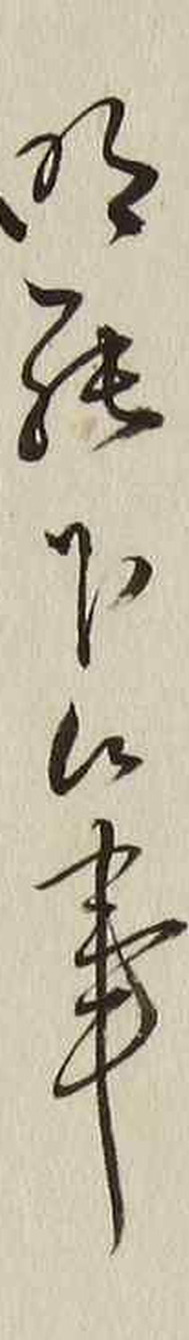明罷下候事
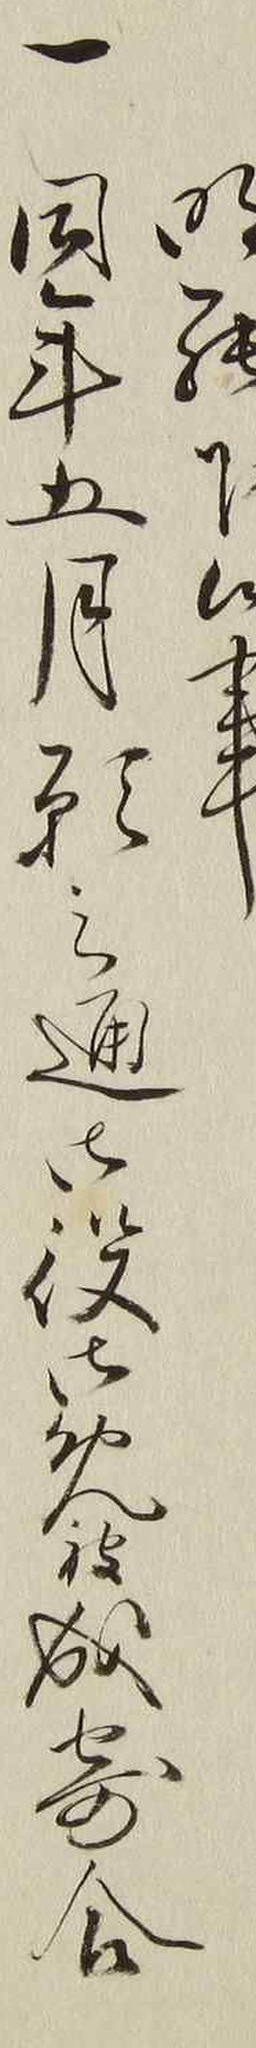一同年五月願之通御役御免被成寄合
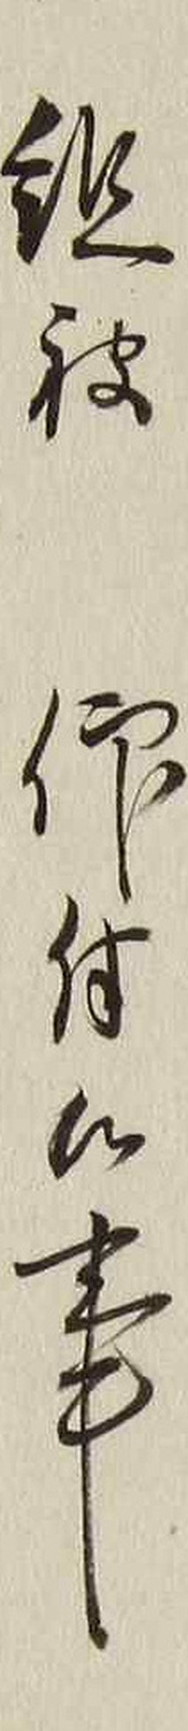組被仰付候事
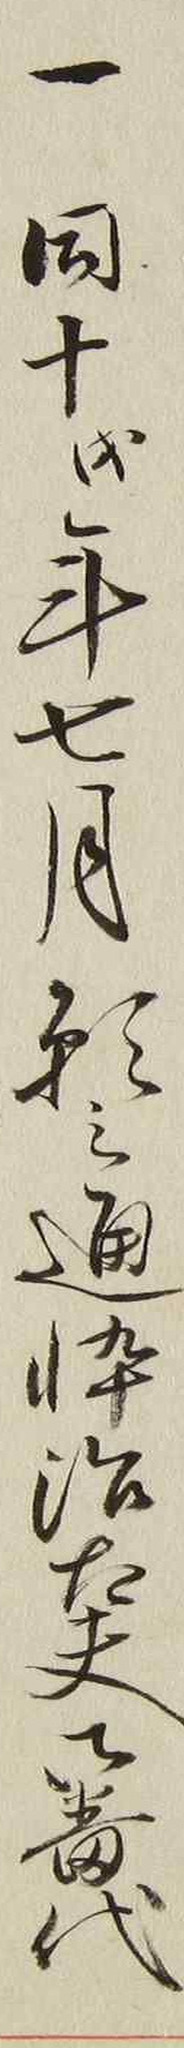一同十戌年七月願之通忰治太夫御番代
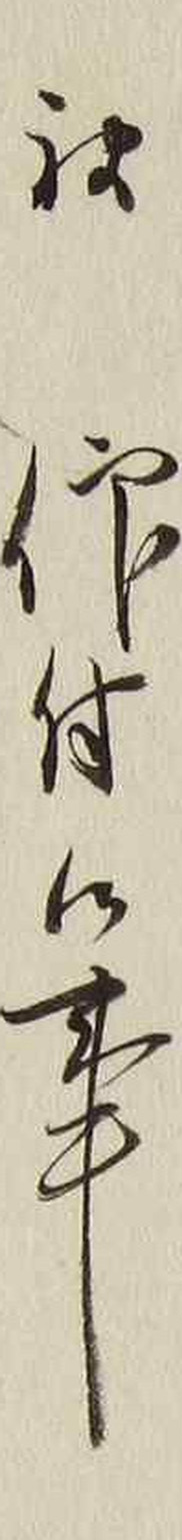被仰付候事
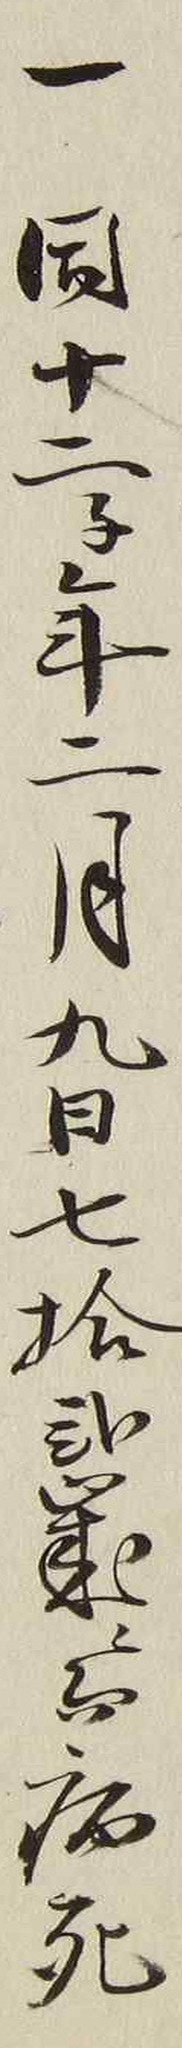一同十二子年九日七拾弐才ニ而病死
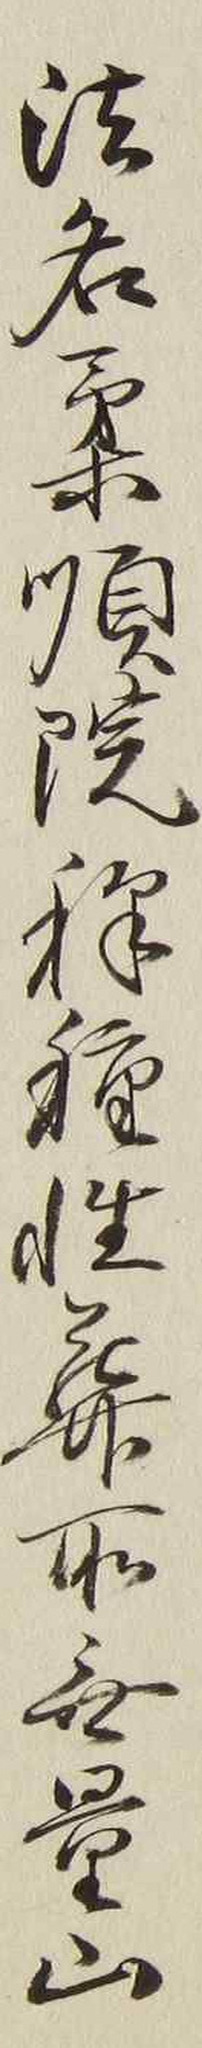法名柔順院釈種性葬所無量山
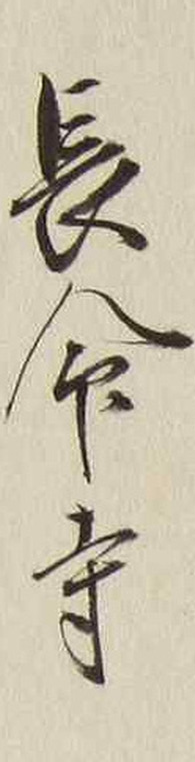長命寺

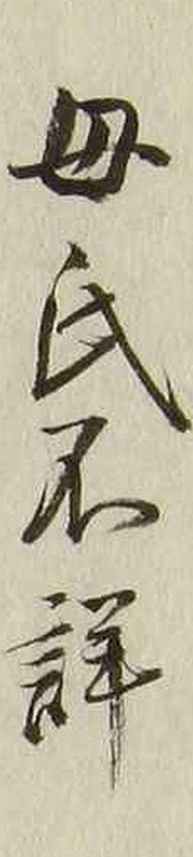母氏不詳
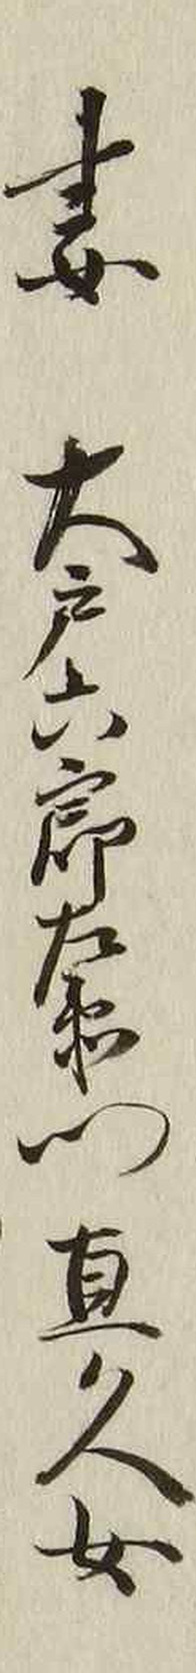妻大戸六郎左衛門直久女
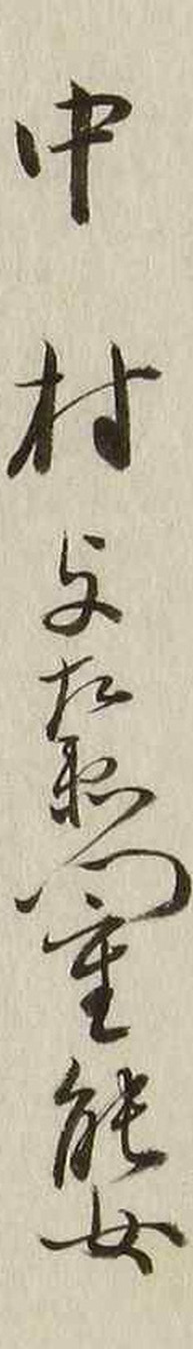中村与左衛門重能女
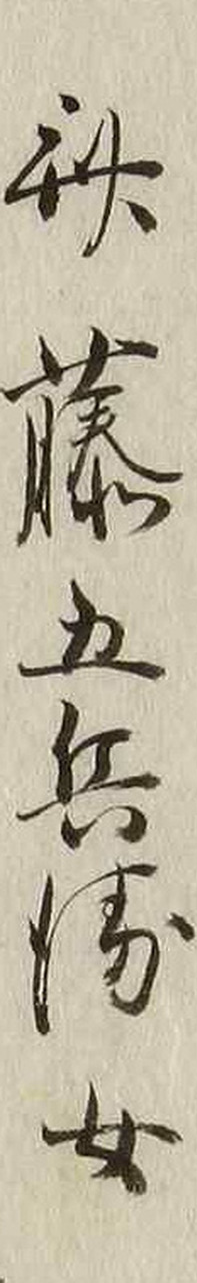州藤五兵衛女
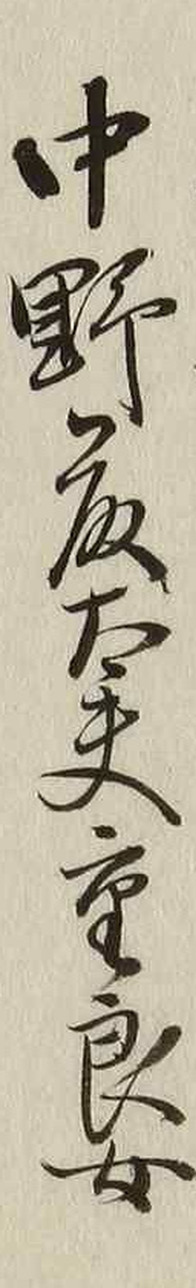中野藤太夫重良女
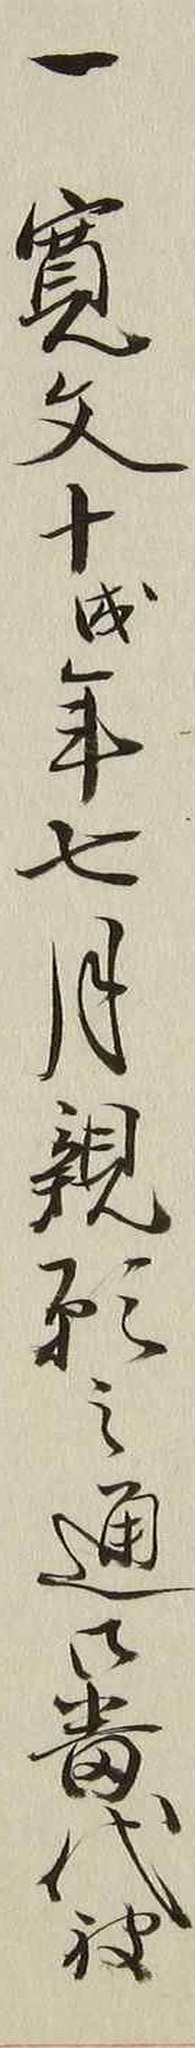一寛文十戌年七月親願之通御番代被
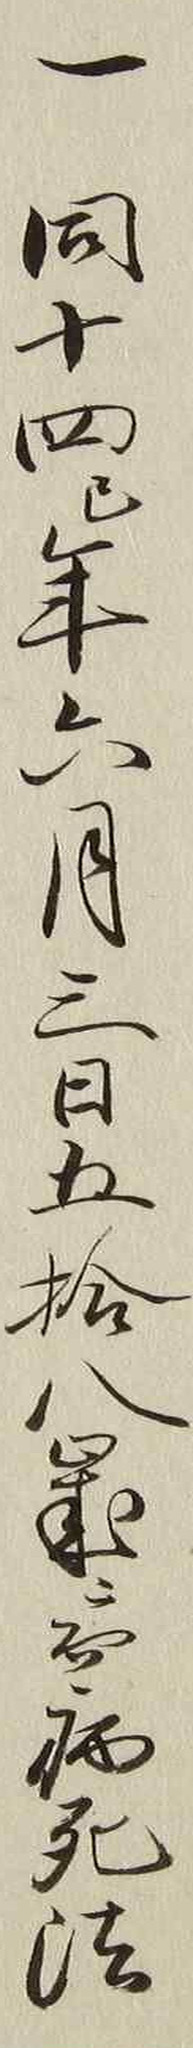一同十四巳年六月三日五拾八歳ニ而病死法
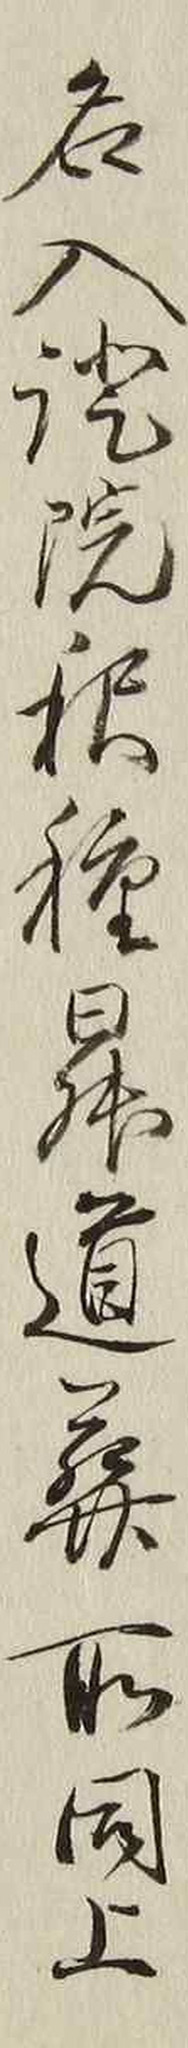名入證院釈種昴道葬所同上
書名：諸士系譜　巻之163　な之部5
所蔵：会津若松市立会津図書館
